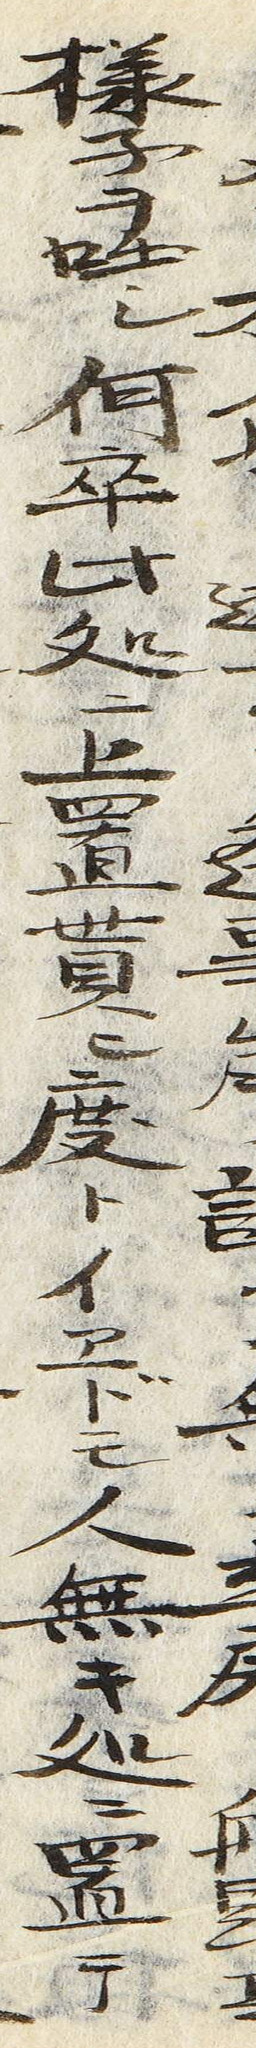様子ヲ吐シ何卒此処ニ上置貰ヒ度トイエドモ人無キ処ニ置テ
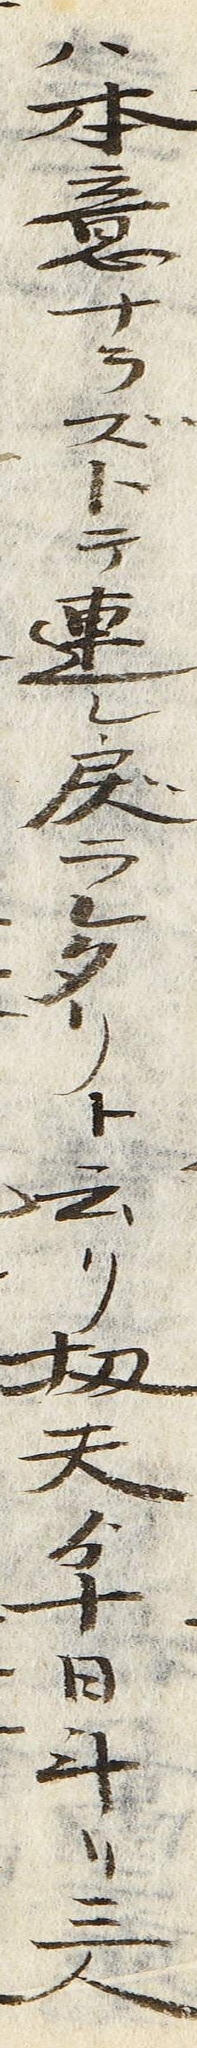ハ本意ナラズトテ連レ戻ラレタリト云リ扨夫ゟ十日計リ三人
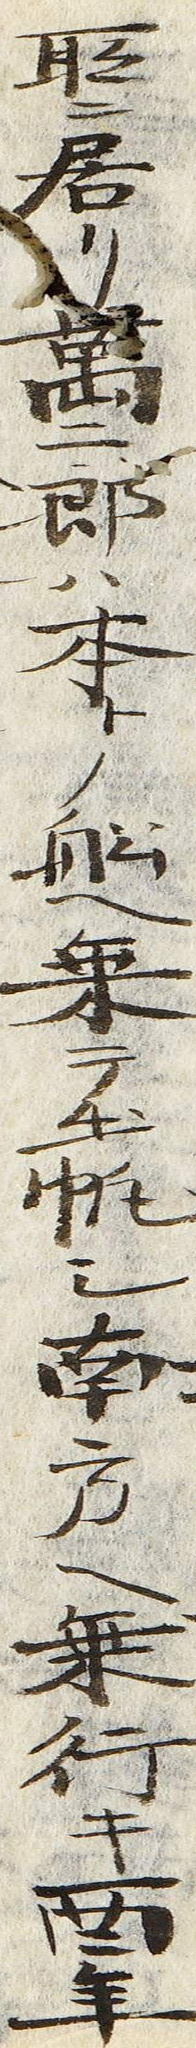茲ニ居リ萬二郎ハ本トノ船ヘ乗テ出航シ南方ヘ乗行キ酉年
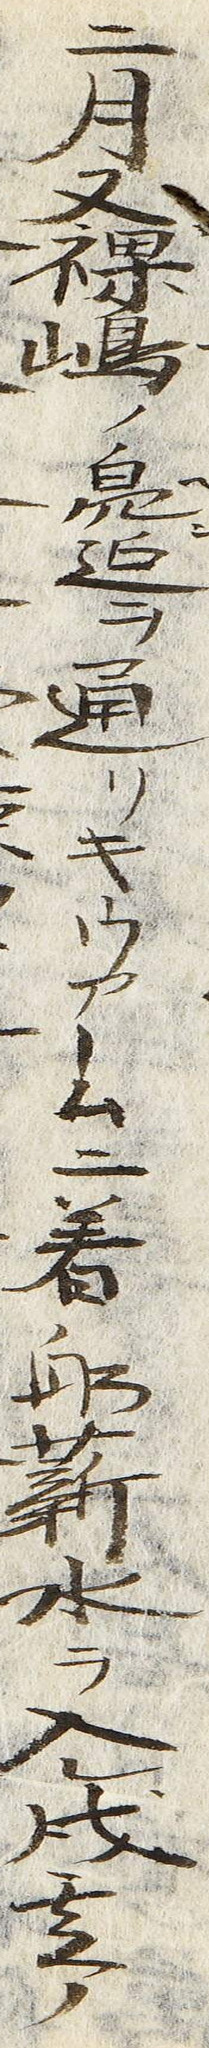二月又裸嶋ノ辺近ヲ通リキウア❘ムニ着船薪水ヲ入レ戌亥ノ
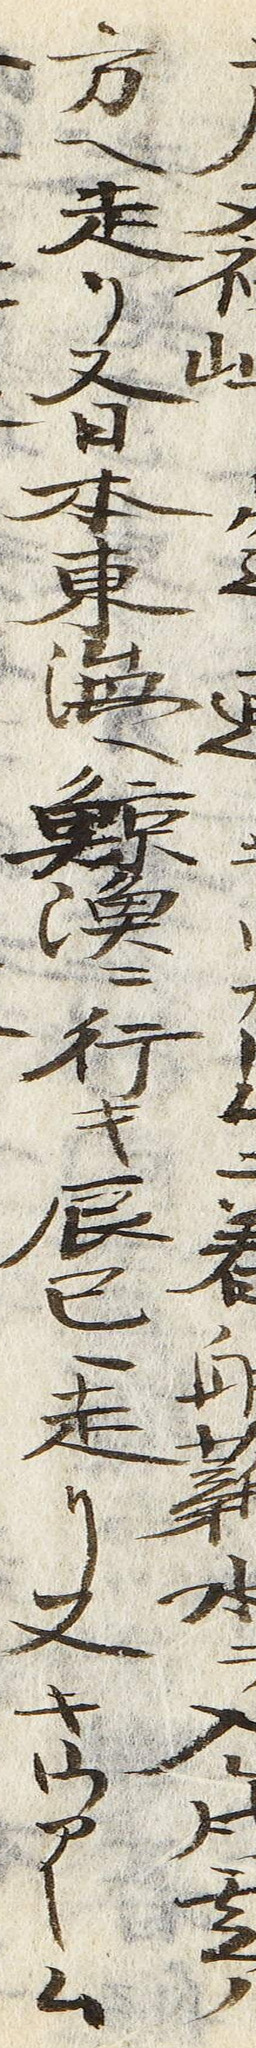方ヘ走リ又日本東端ヘ鯨漁ニ行キ辰巳へ走リ又キウア❘ム
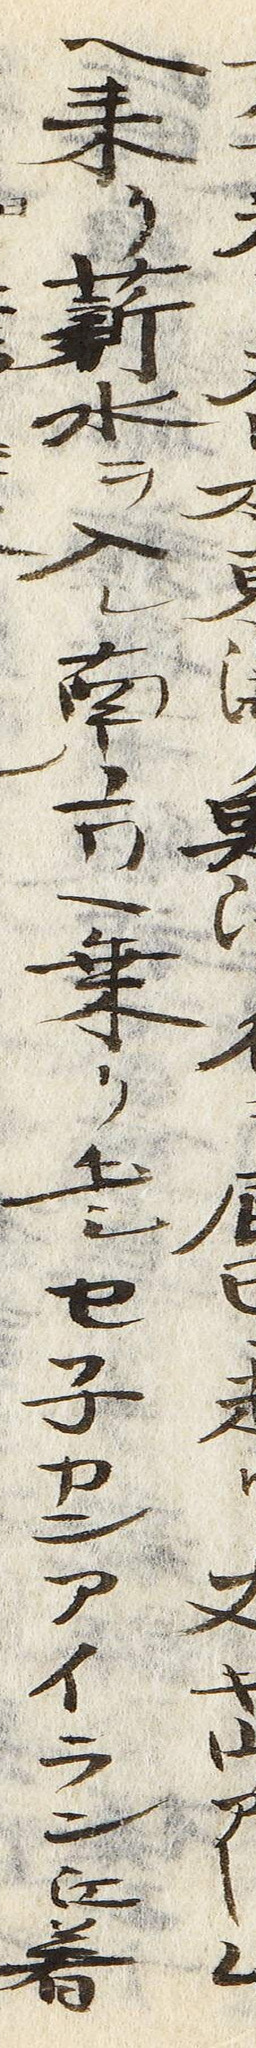ヘ来リ薪水ヲ入レ南方ヘ乗リ出シセネカンアイランえ着
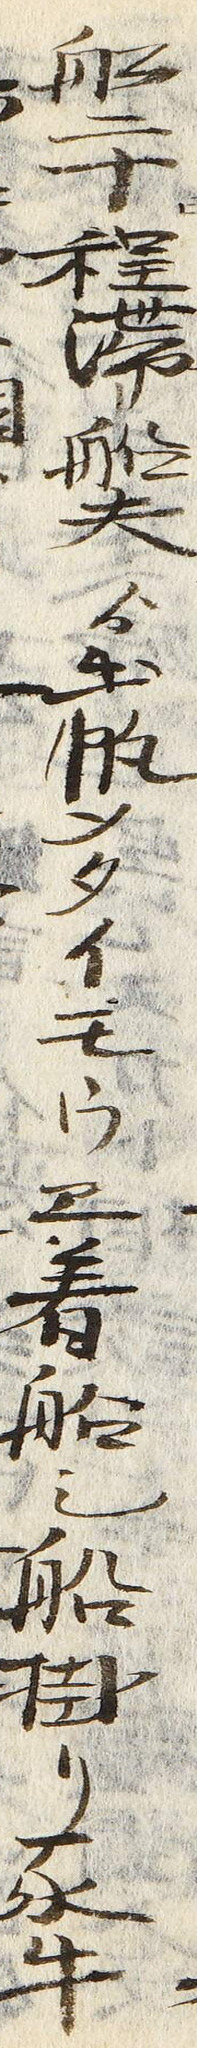船二十日程滞船夫ゟ出航メタイモウエ着船シ船掛リ豚牛
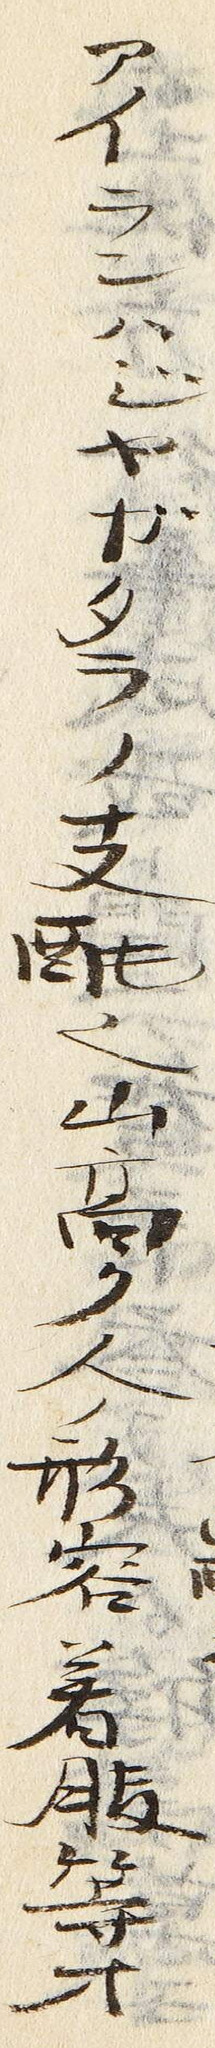アイランハジヤガタラノ支配也山高ク人ノ形容着服等オ
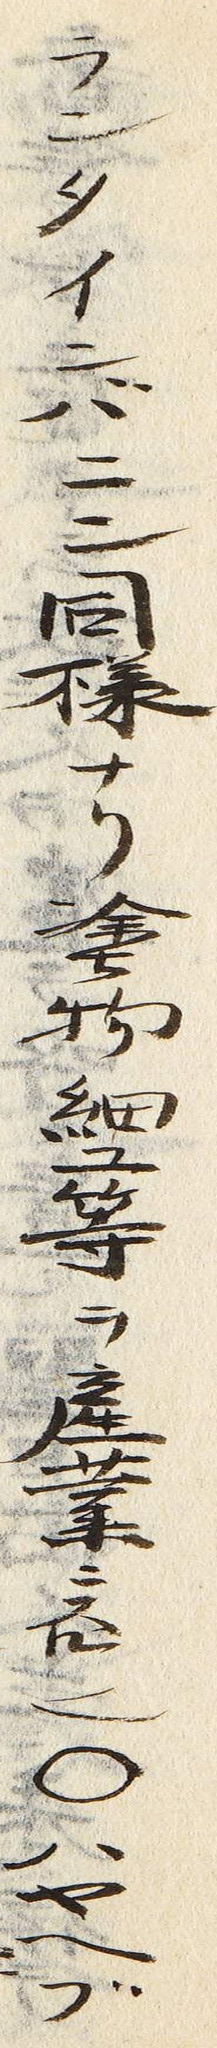ランタインバニン同様ナリ塗物細工等ヲ産業ニスル也〇ハヤヘブ
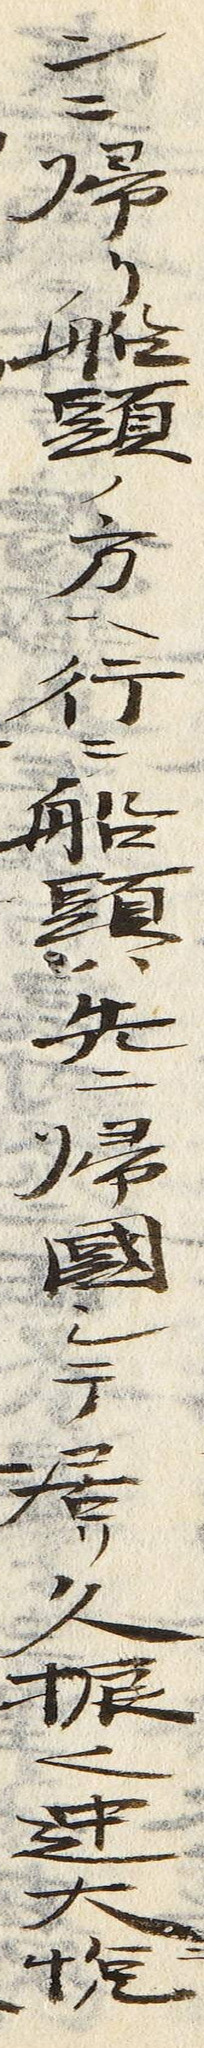ンニ帰リ船頭ノ方ヘ行ニ船頭ハ先ニ帰国シテ居リ久振也迚大悦
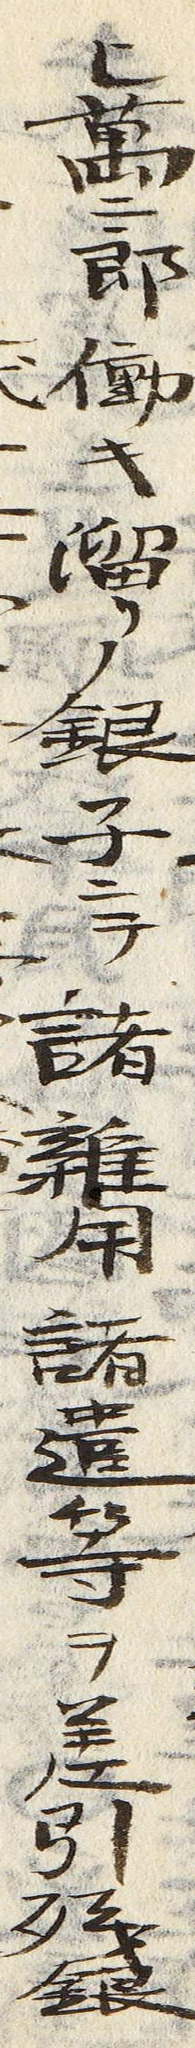シ萬二郎働キ溜リノ銀子ニテ緒雑用諸遣等ヲ差引残銀
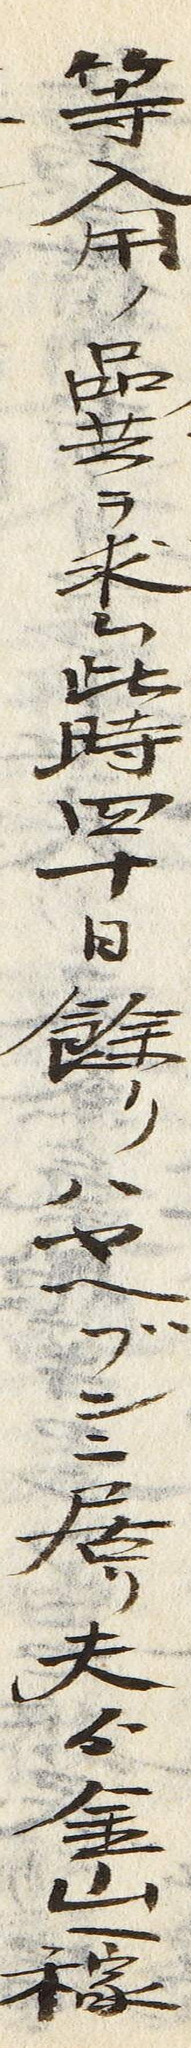等入用ノ品共ヲ求ム此時四十日余リハヤヘブンニ居リ夫ゟ金山ヘ稼
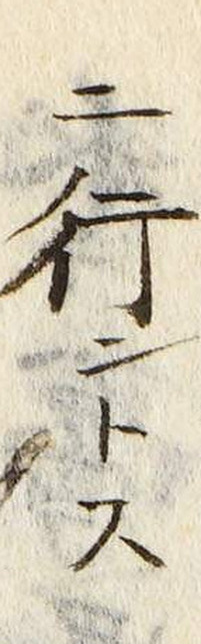ニ行ントス
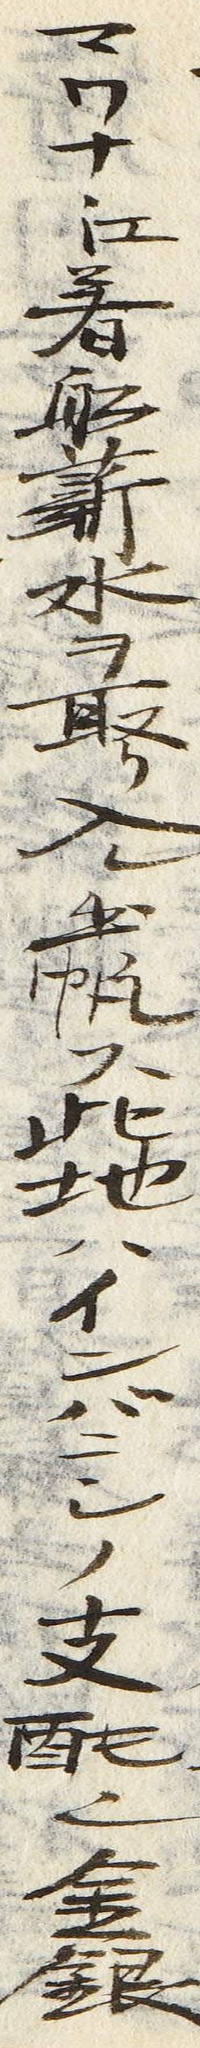マワナえ着船薪水ヲ取リ入レ出航ス此地ハインバンシノ支配也金銀
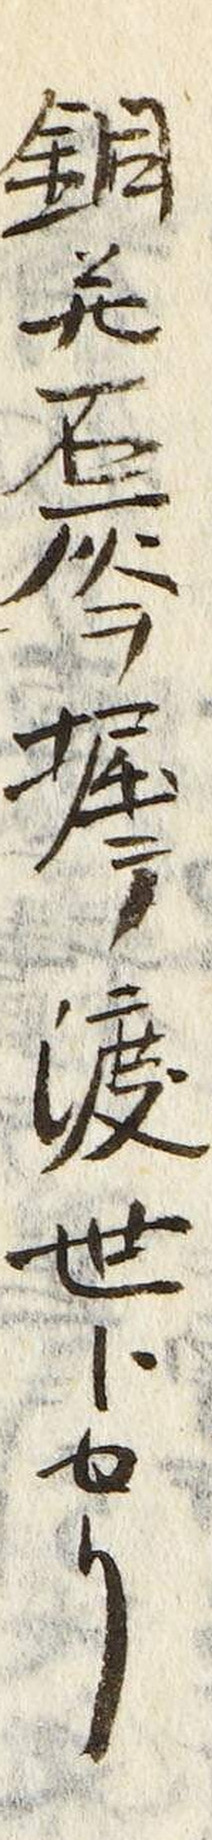銅并石灰ヲ堀テ渡世トセリ
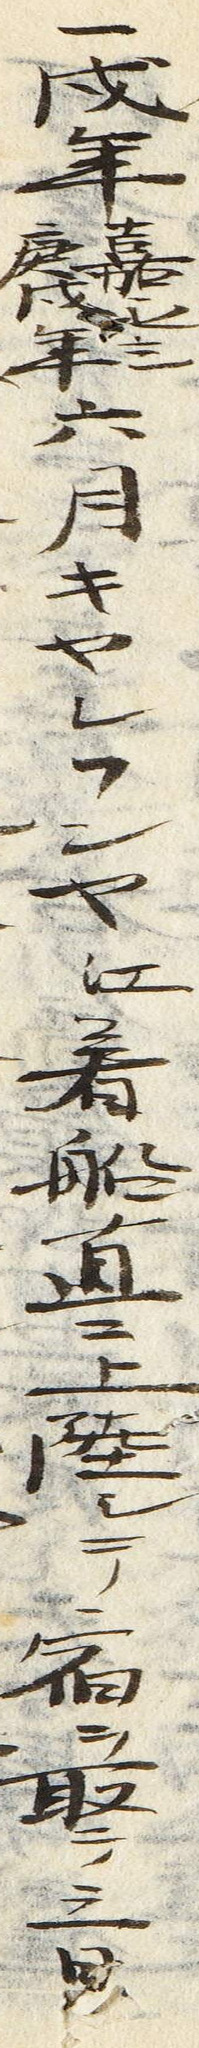一戌年嘉永三庚戌年六月キヤレフンヤえ着船直ニ上陸シテ宿ヲ取テ三日
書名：漂流記聞
